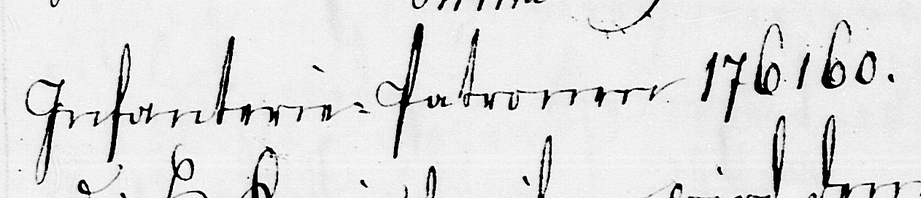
Infanterie-Patronen 176160.
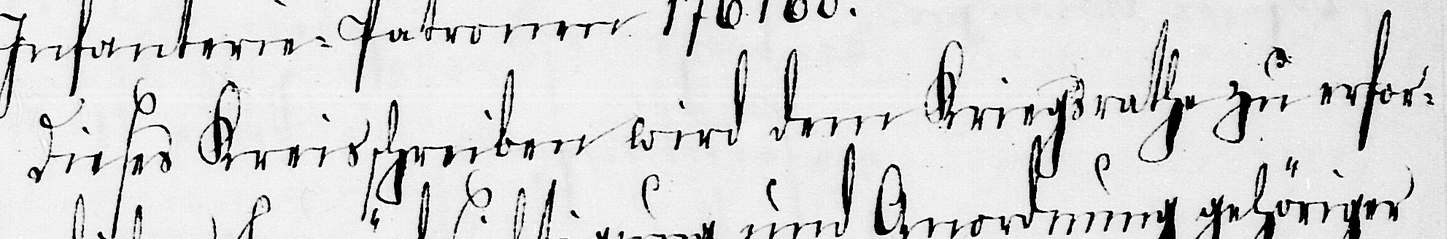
Dieses Kreisschreiben wird dem Kriegsrathe zu erfor¬
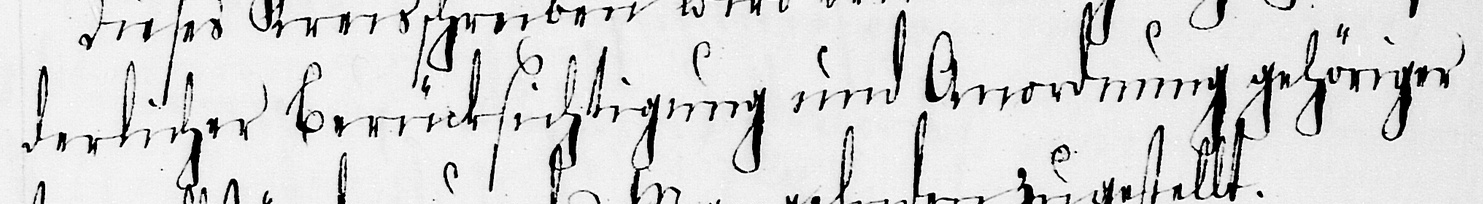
derlicher Berücksichtigung und Anordnung gehöriger
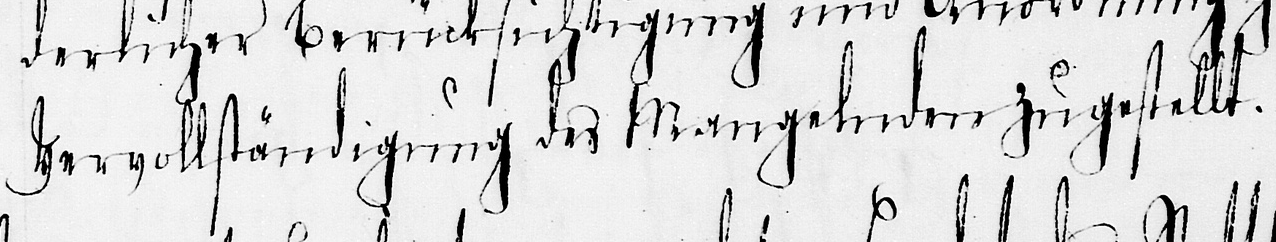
Vervollständigung des Mangelnden zugestellt.
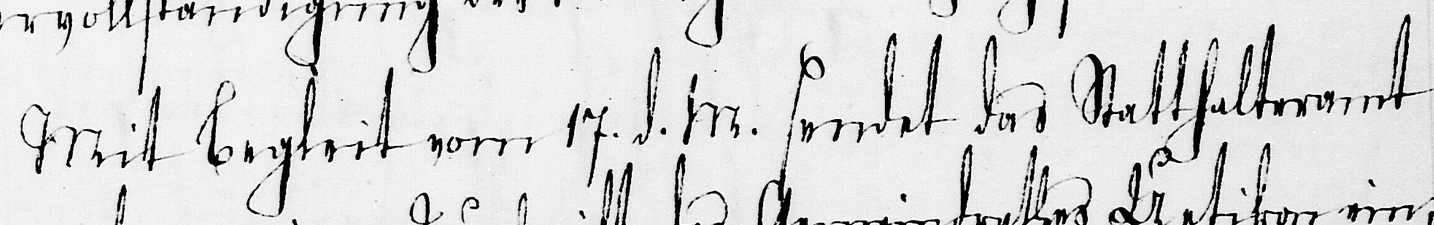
Mit Begleit vom 17. d. M. sendet das Statthalteramt
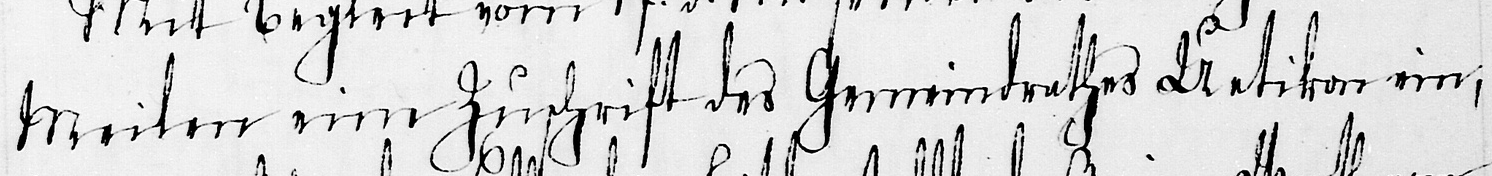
Meilen eine Zuschrift des Gemeindrathes Uetikon ein,
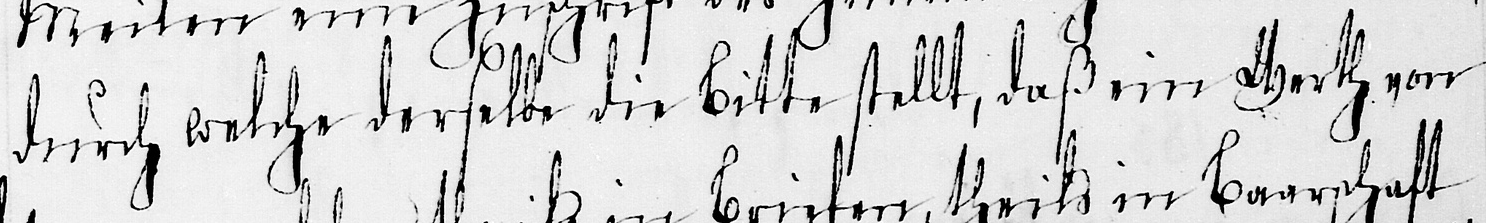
durch welche derselbe die Bitte stellt, daß ein Werth von
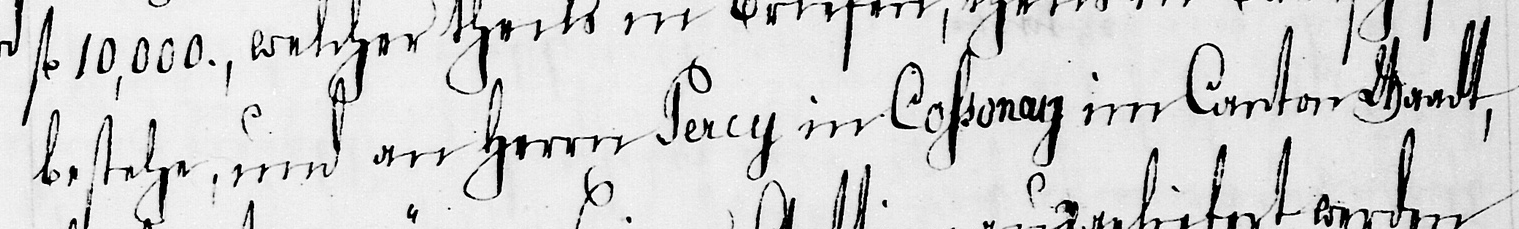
bestehe, und an Herrn Percy in Cossonay im Canton Waadt,
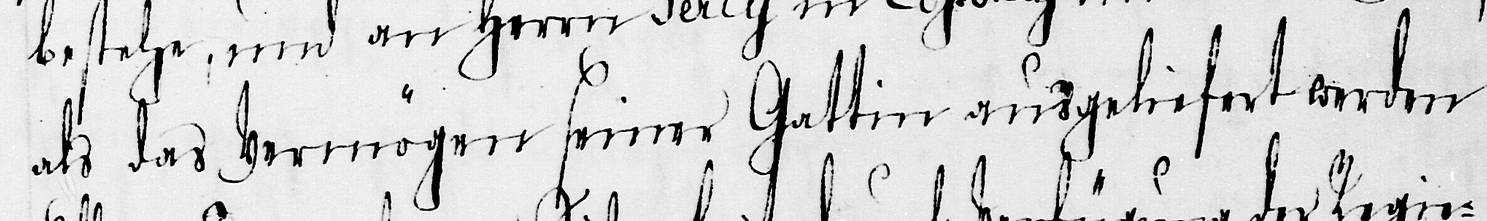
als das Vermögen seiner Gattin ausgeliefert werden
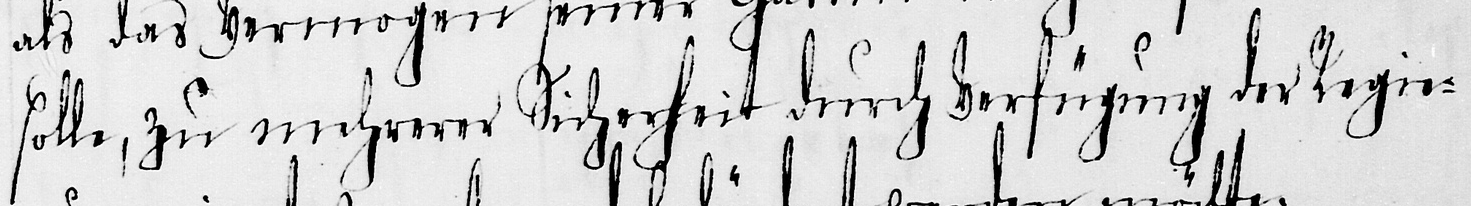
solle, zu mehrerer Sicherheit durch Verfügung der Regie¬
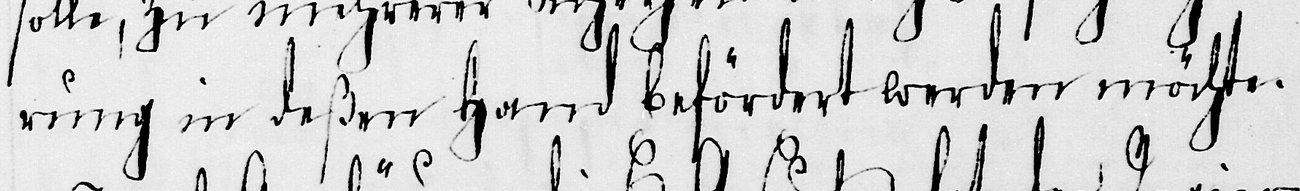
rung in deßen Hand befördert werden möchte.
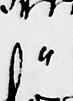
22.
